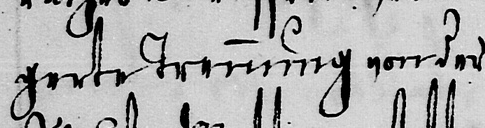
gerte Trennung von der
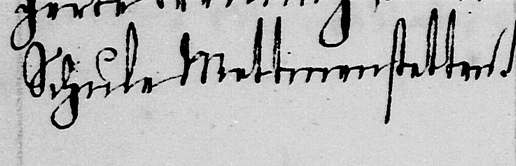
Schule Mettmenste¬
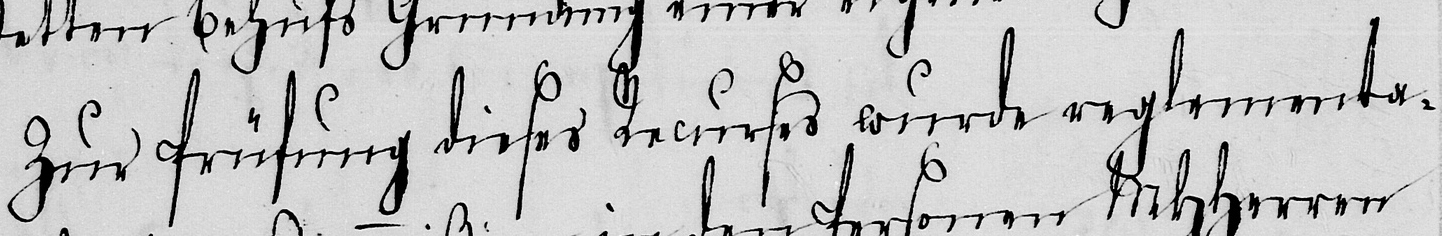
Zur Prüfung dieses Recurses wurde reglementa¬
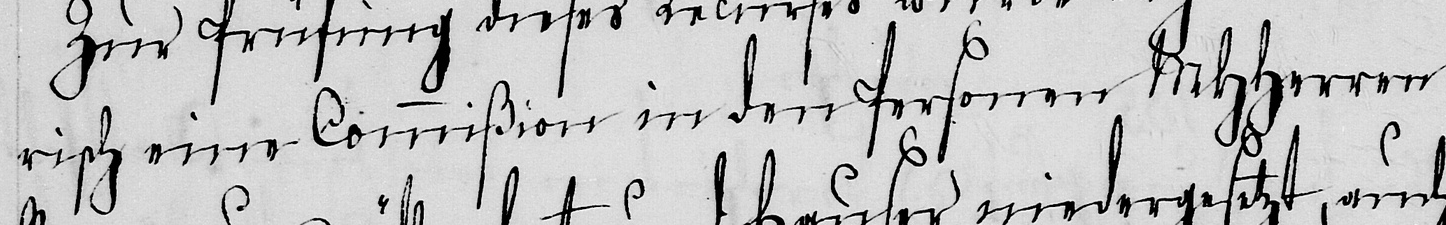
risch eine Commißion in den Personen MHHerren
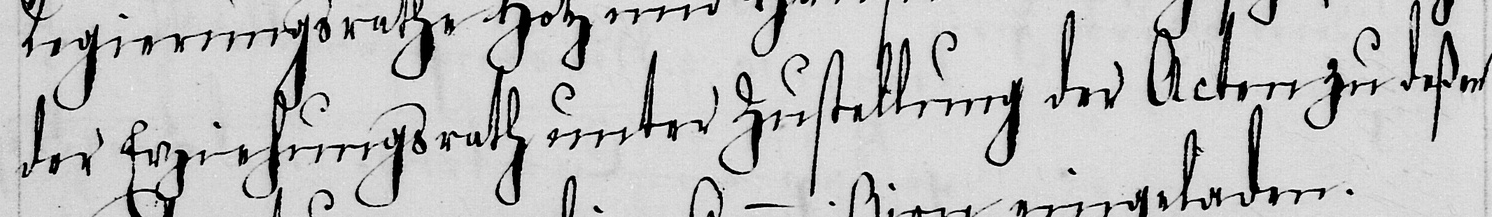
der Erziehungsrath unter Zustellung der Acten zu deßen
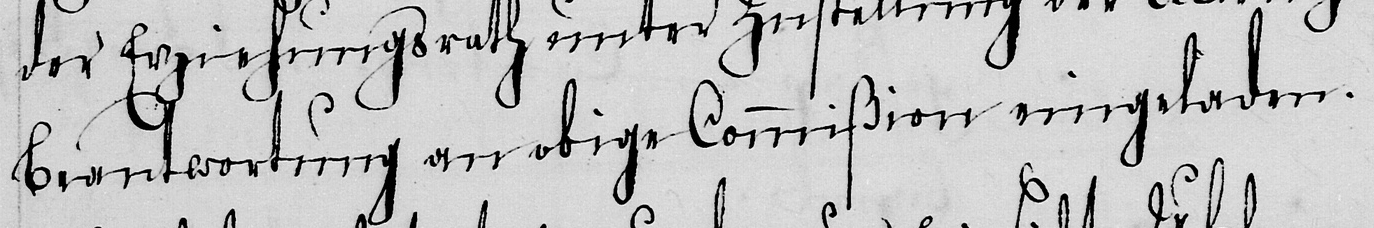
Beantwortung an obige Commißion eingeladen.
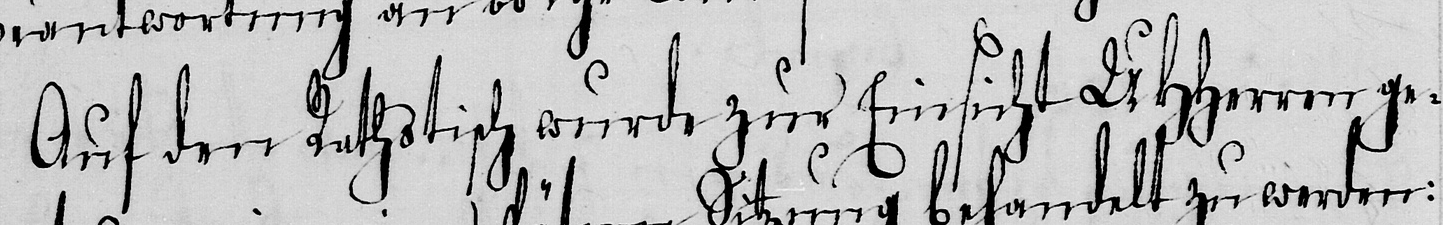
Auf den Rathstisch wurde zur Einsicht UHHerren ge¬
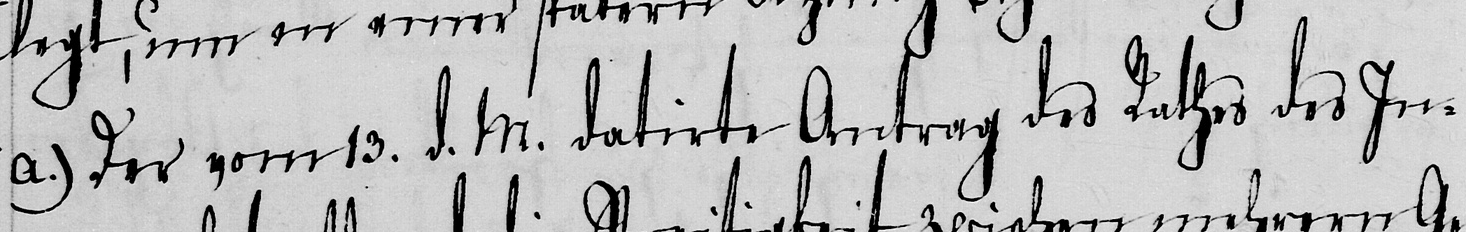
a.) Der vom 13. d. M. datirte Antrag des Rathes des In¬
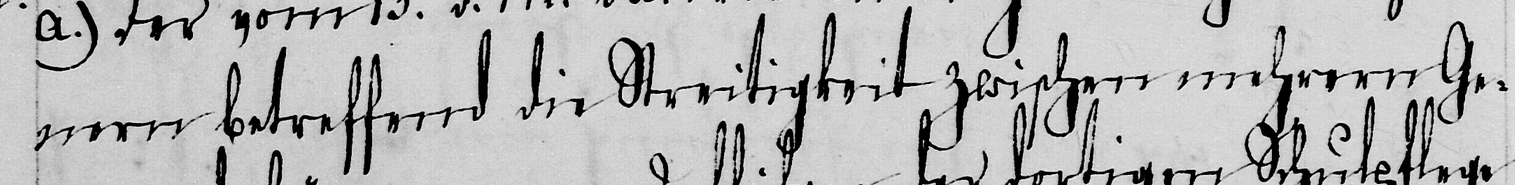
nern betreffend die Streitigkeit zwischen mehrern Ge¬
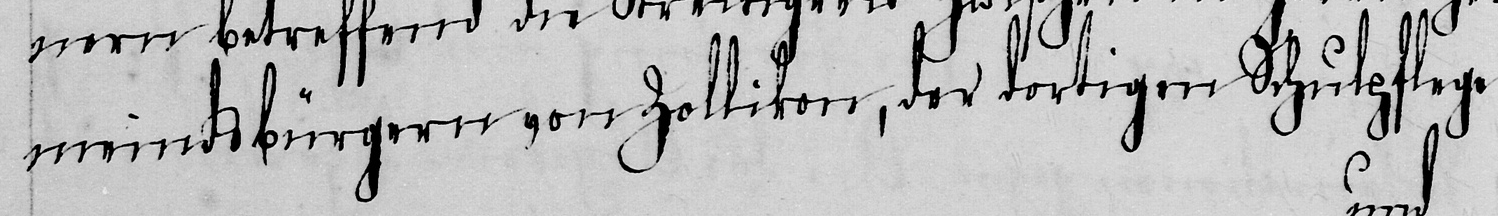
meindsbürgern von Zollikon, der dortigen Schulpflege
